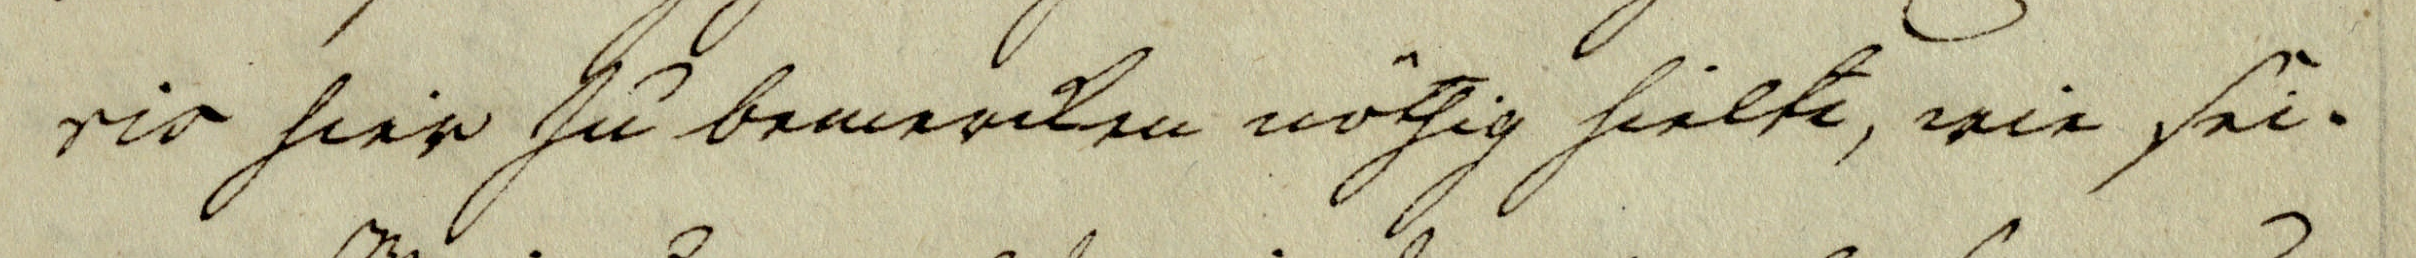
ris hier zu bemercken nöthig hielte, wie sei¬
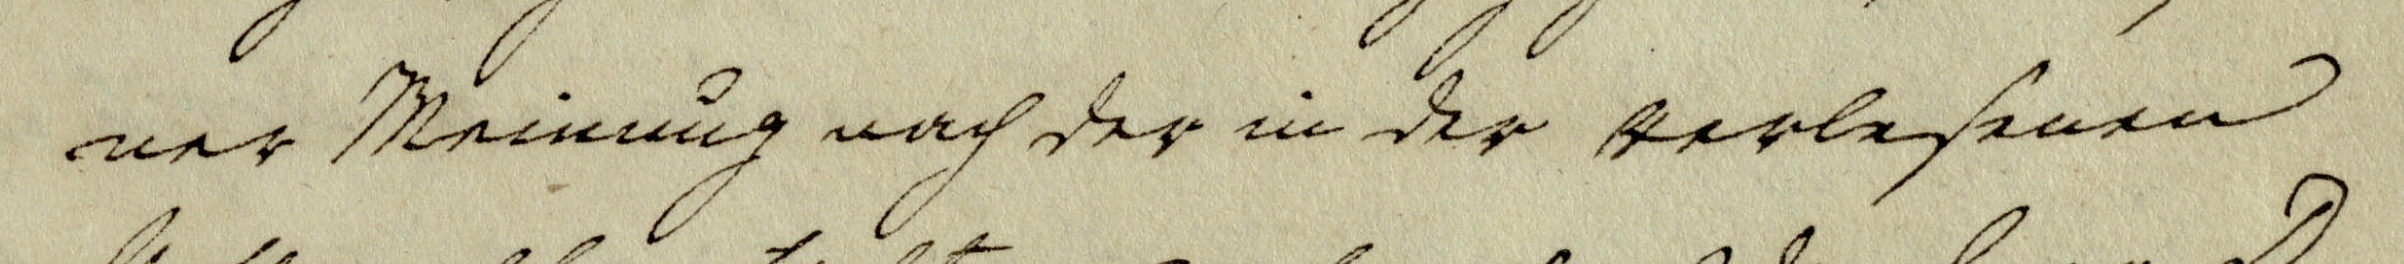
ner Meinung nach der in der verlesenen
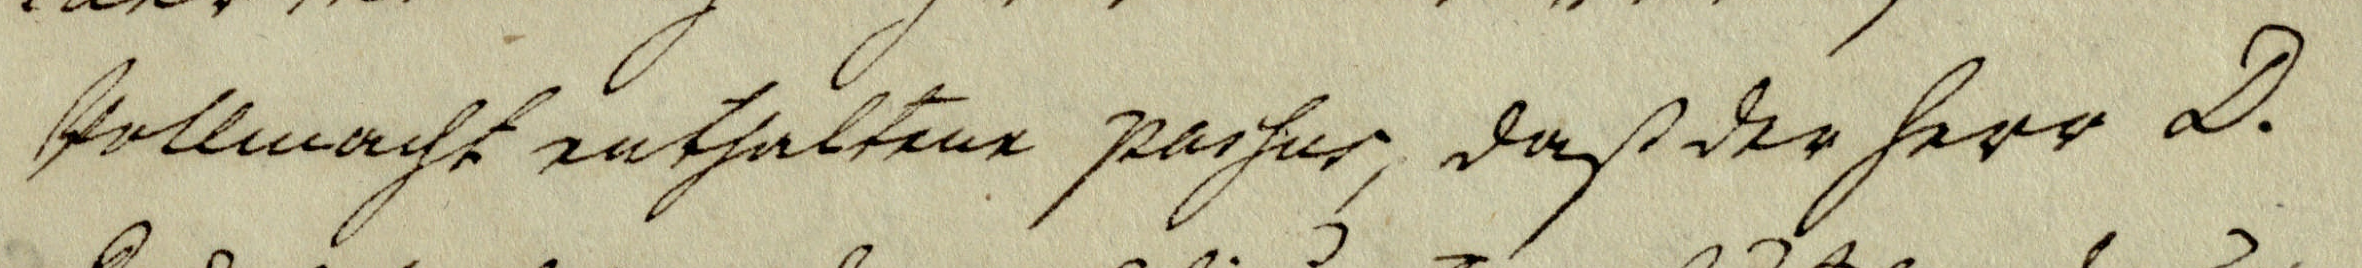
Vollmacht enthaltene passus, daß der Herr D.
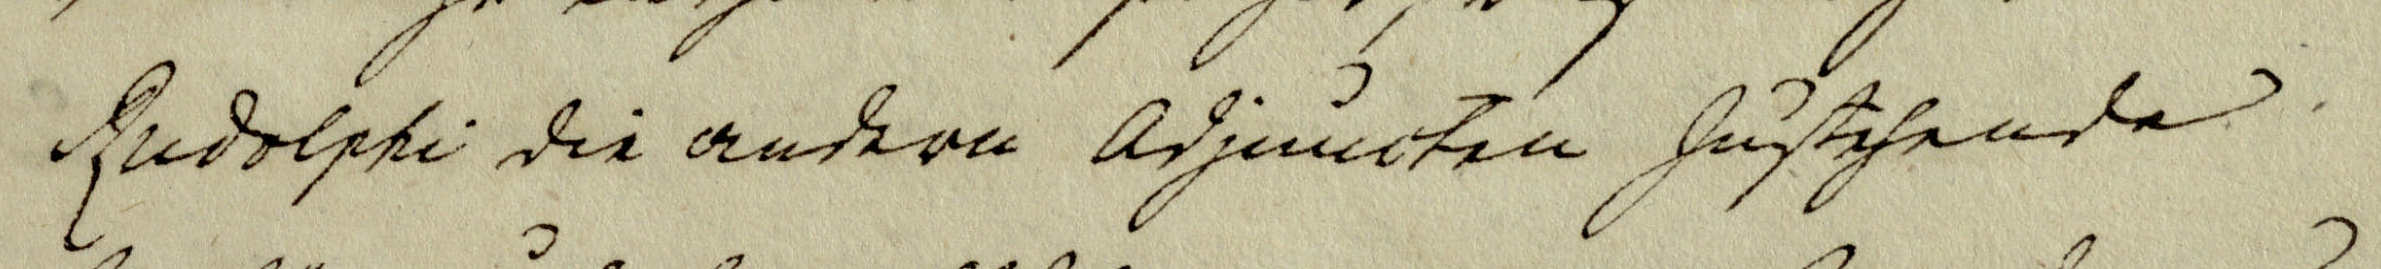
Rudolphi die andern Adjuncten zustehende
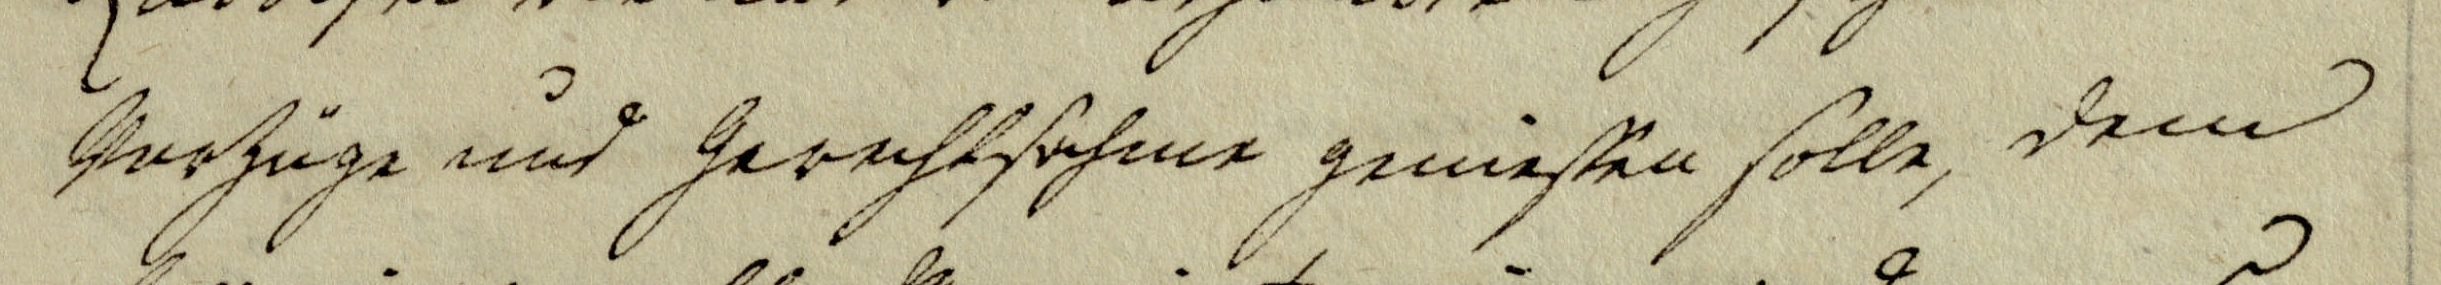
Vorzüge und Gerechtsahme geniessen solle, dem
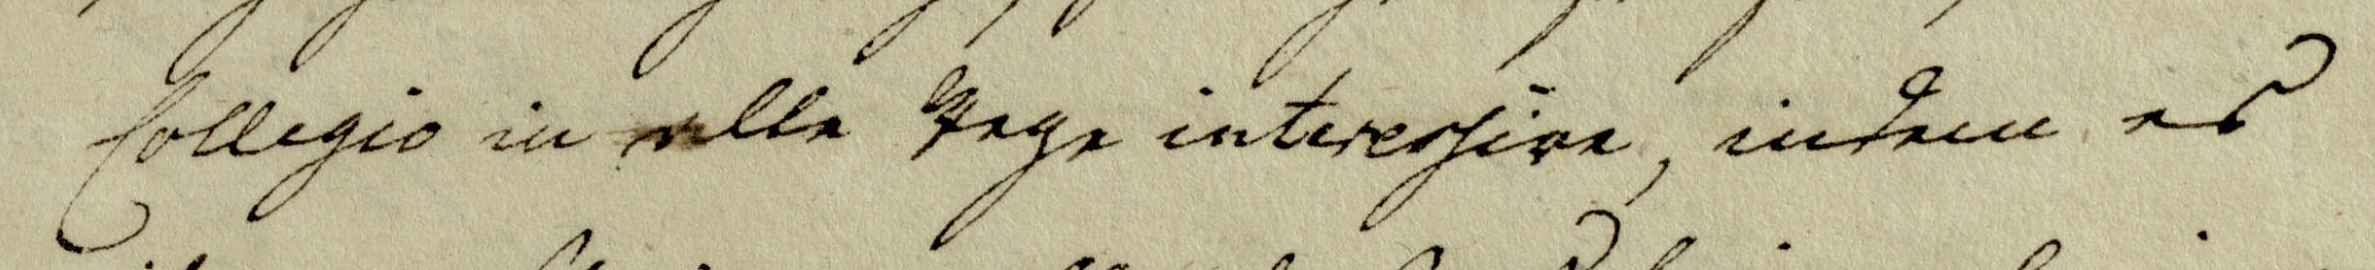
Collegio in alle Wege interessire, indem es
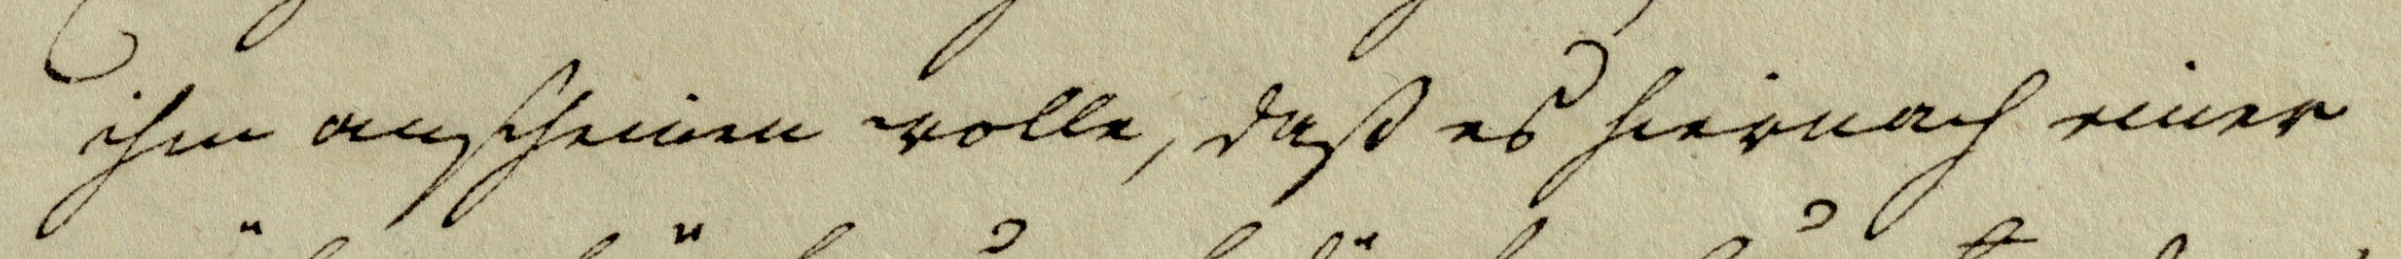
ihm anscheinen wolle, daß es hiernach einer
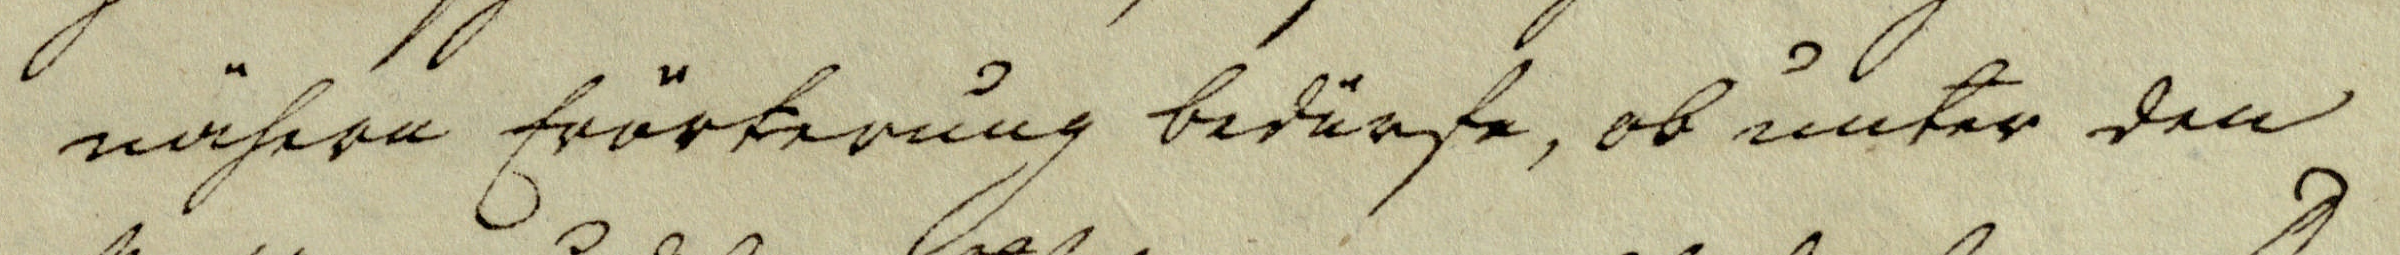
nähern Erörterung bedürfe, ob unter den
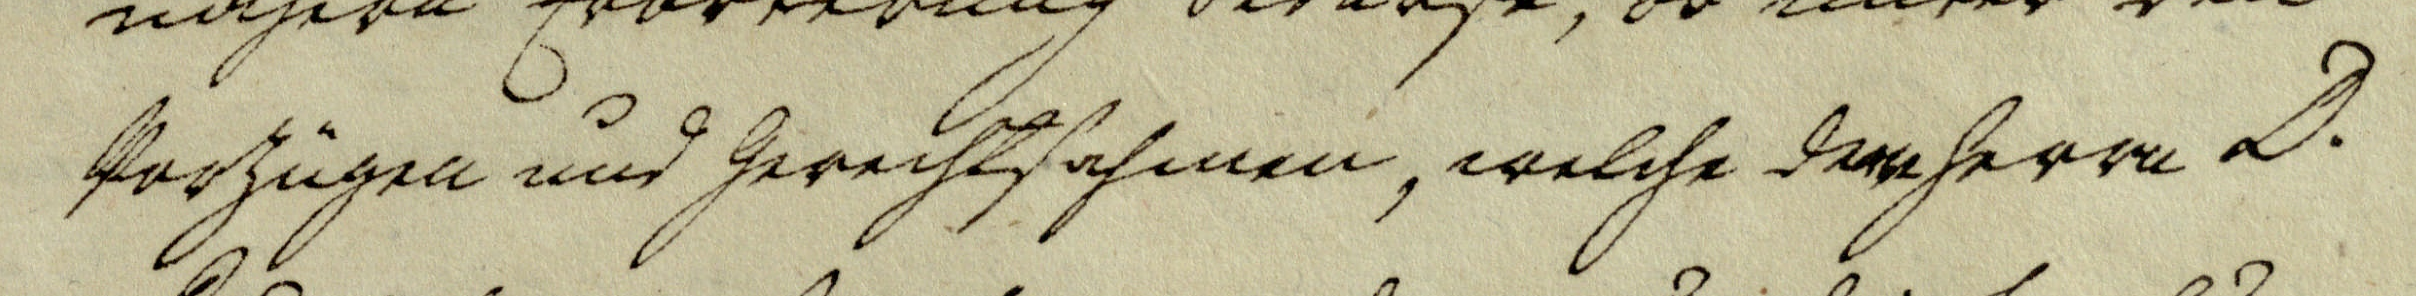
Vorzügen und Gerechtsahmen, welche dem Herrn D.
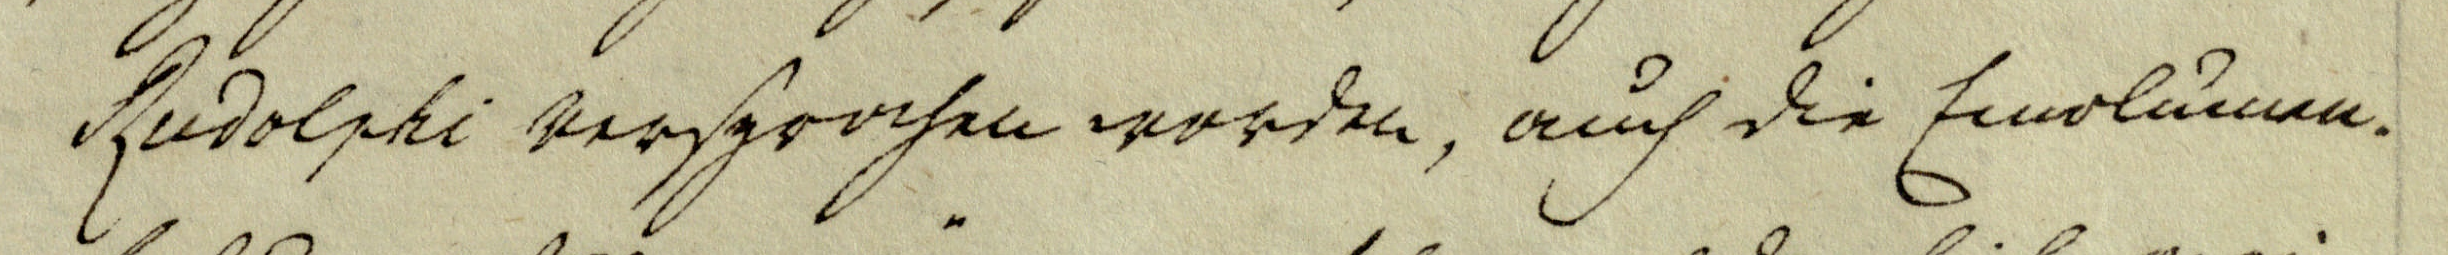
Rudolphi versprochen worden, auch die Emolumen¬
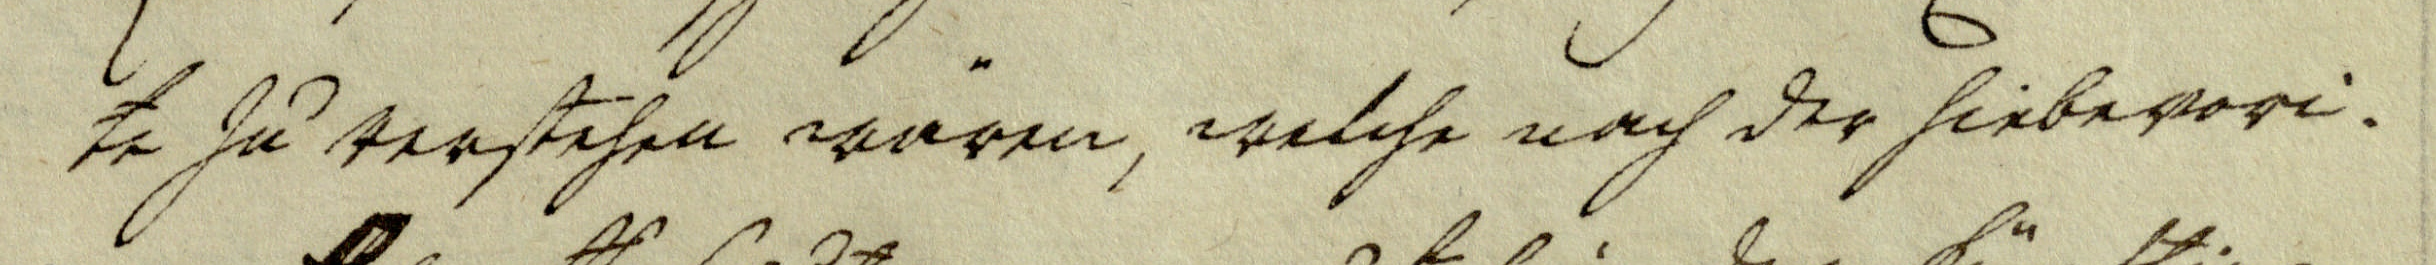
te zu verstehen wären, welche nach der hiebevori¬
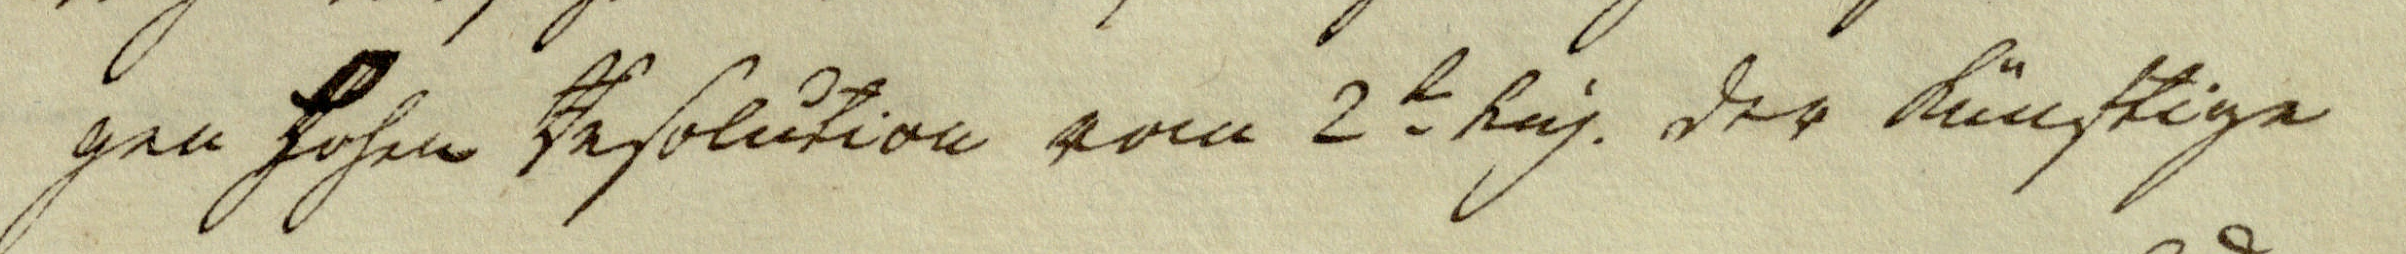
gen Hohen Resolution vom 2 t. huj. der künftige
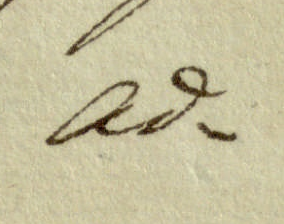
Ad
